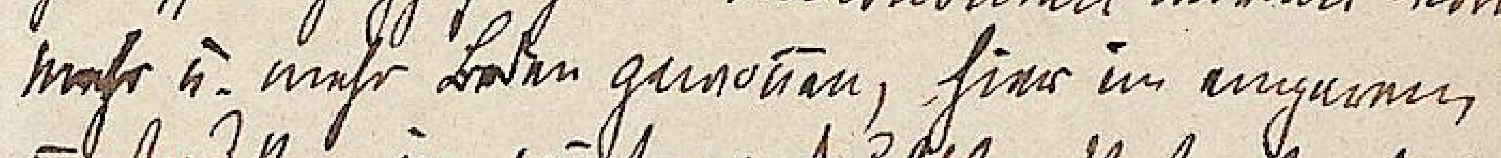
mehr u. mehr Boden gewonen, hier in engeren,
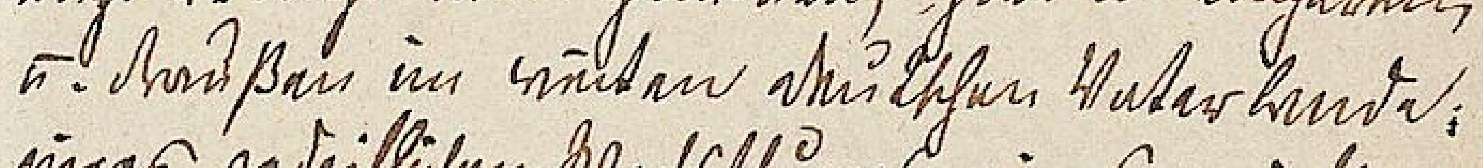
u. draußen im weiten deutschen Vaterlandete.
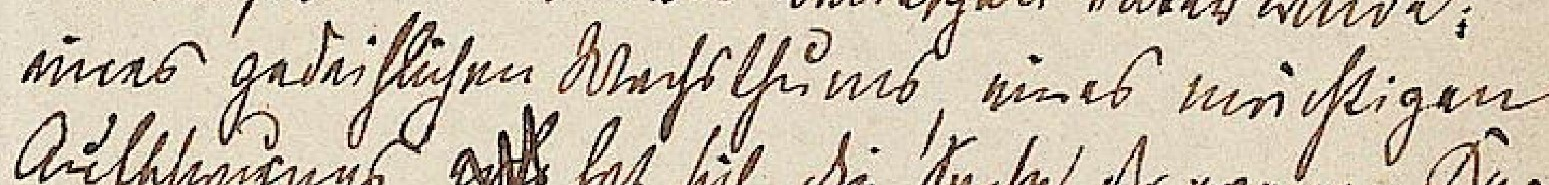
eines gedeihlichen Wachstums, eines mächtigen
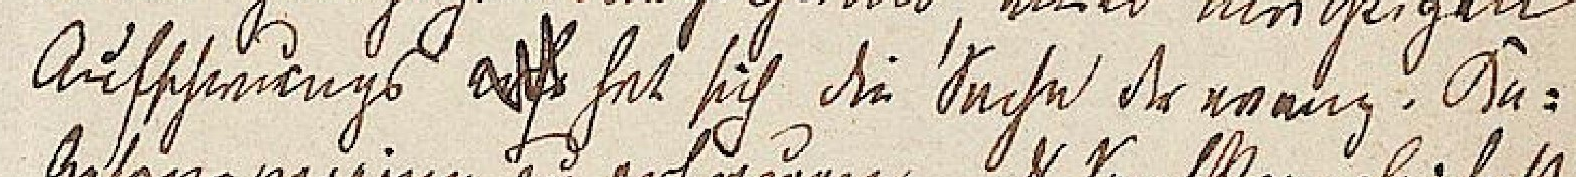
Aufschwungs erh hat sich die Sache der evang. Kn¬
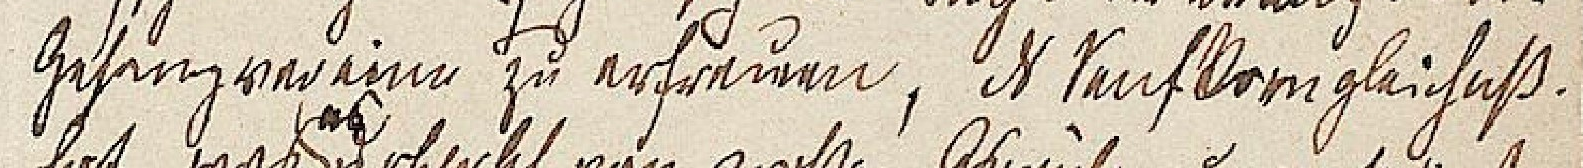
Gesangsvereine zu erfreuen, ds. Senfkorngleichnß
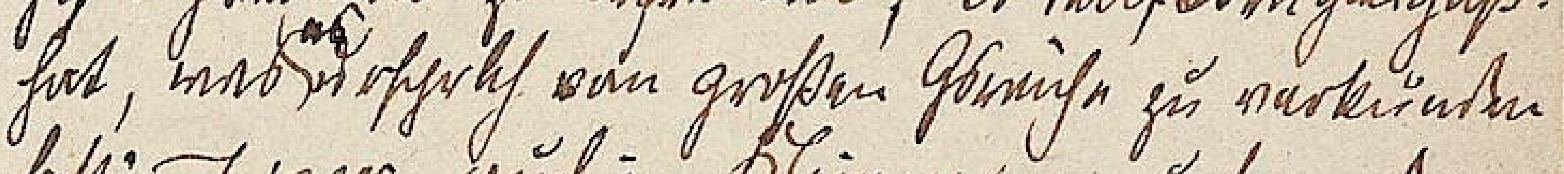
hat, was es ursprlch von großen Gsreche zu verkünden
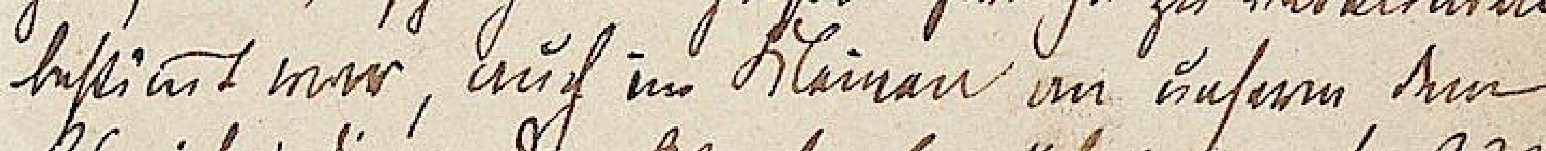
bestimmt war, auch im Kleinen an unserm dem
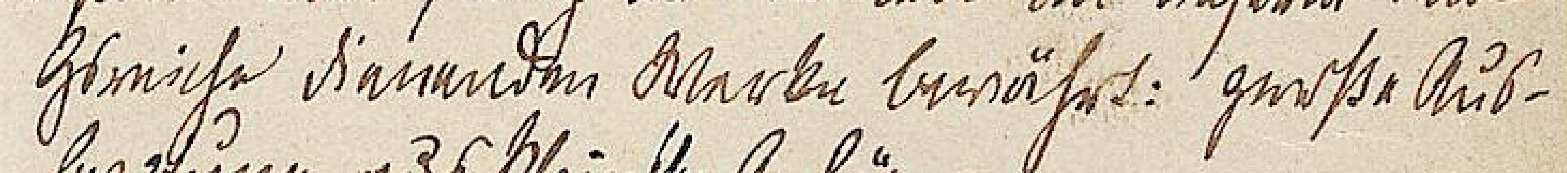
Gsreiche dienenden Werke bewährt: große Aus¬
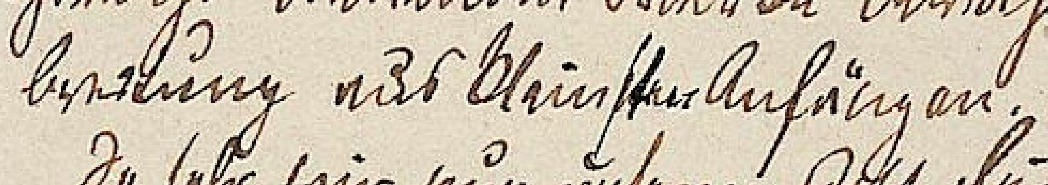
breitung aus kleinsten Anfängen.
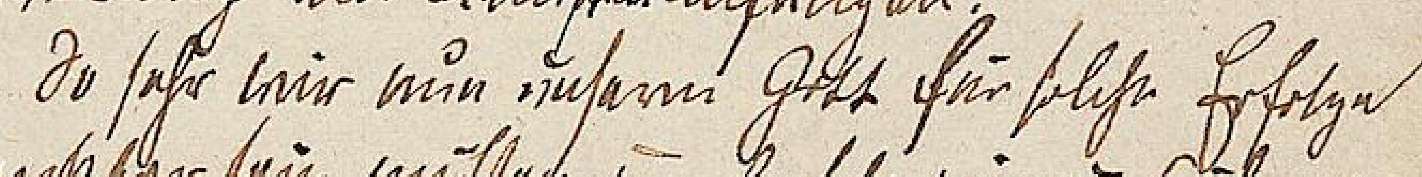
So sehr wir nun unserm Gott für solche Erfolge
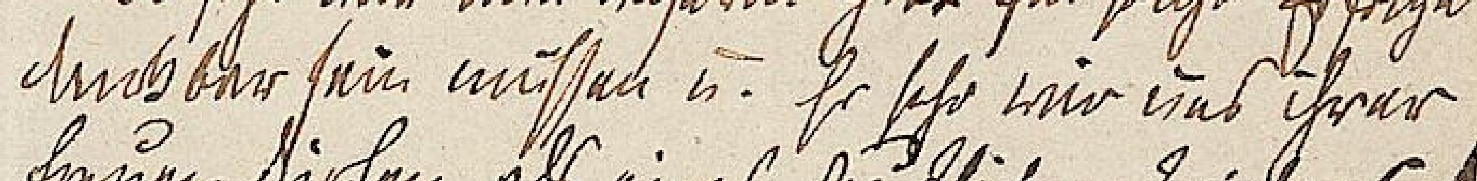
dankbar sein müssen u. so sehr wir uns ihrer
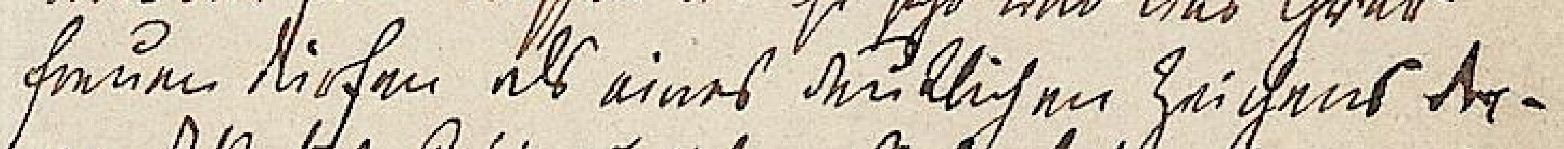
freuen dürfen als eines deutlichen Zeichen da¬
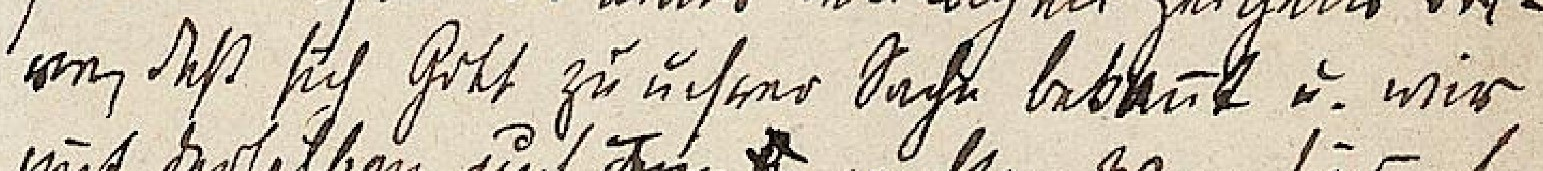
von, daß sich Gott zu unserer Sache bekent u. wir
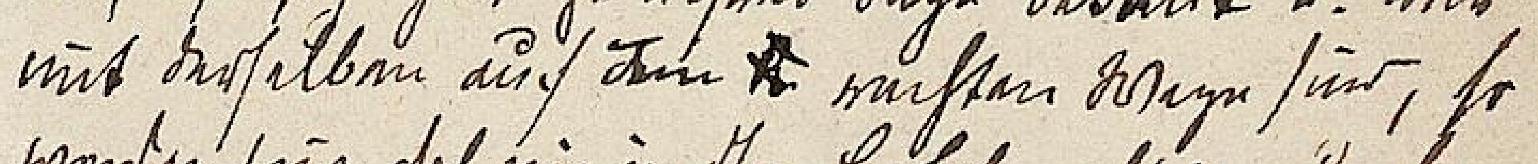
mit derselben dem r rechten Wege sind, so
